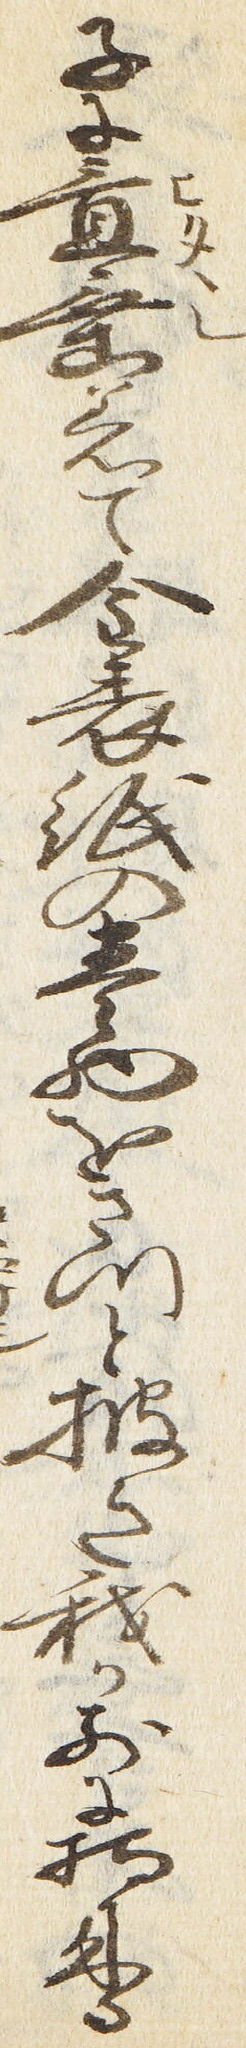子に直垂着て金表紙の巻物をさつと披き我か前に持来る
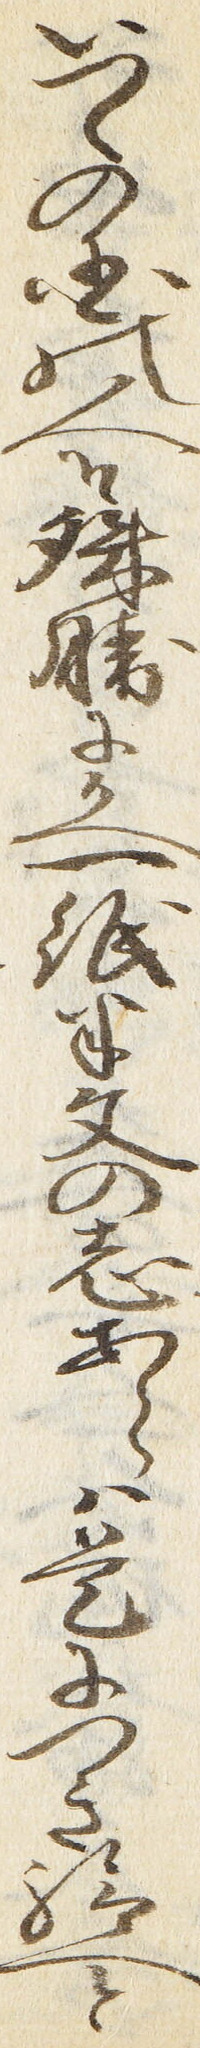いつくの国の人そ殊勝にかへ一紙半文の志あらは是につき給へと
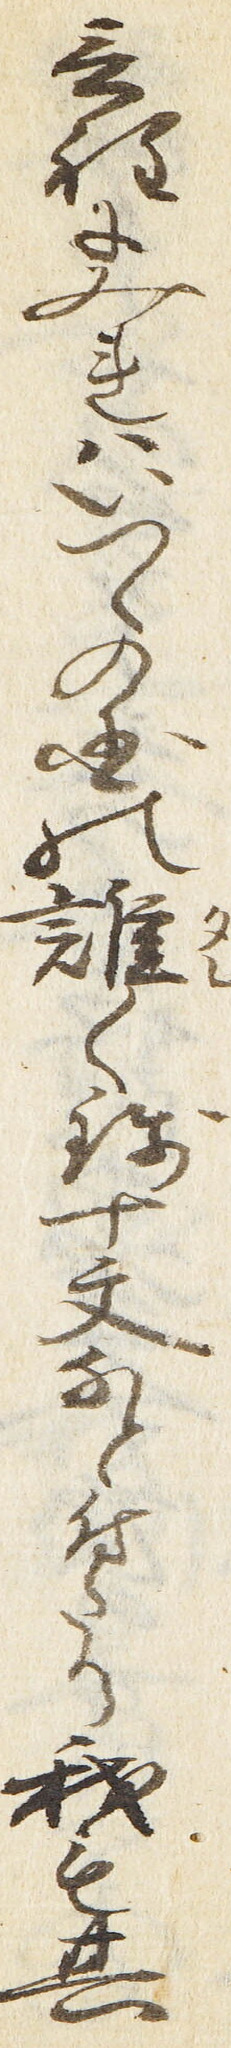言程にみれはいつくの国の誰〳〵銭十文なと付たり我も其
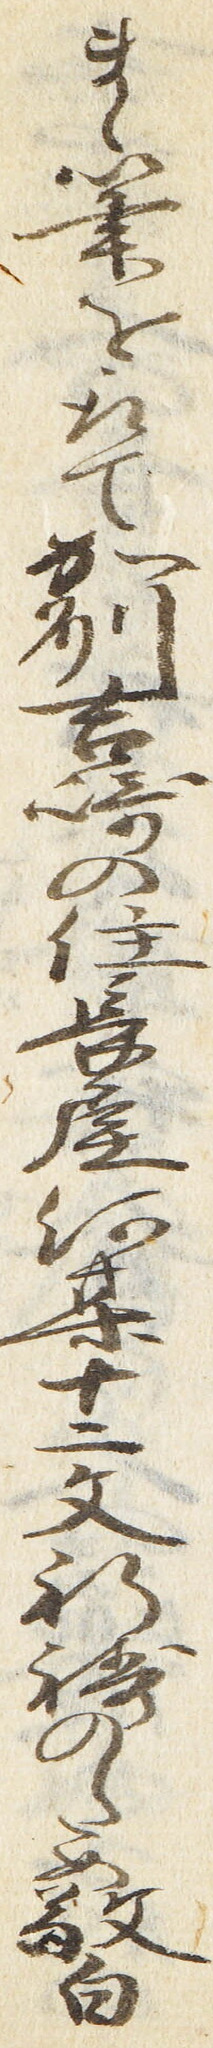まゝ筆を取て加州吉崎の住長屋何某十二文祈祷のため敬白
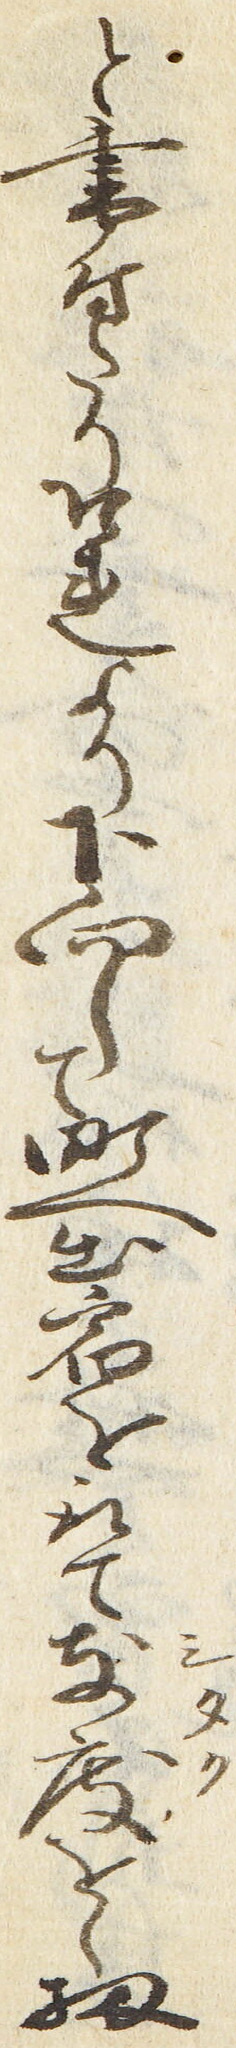と書付たりそれより下向して町へ出宿を取て支度をし扨
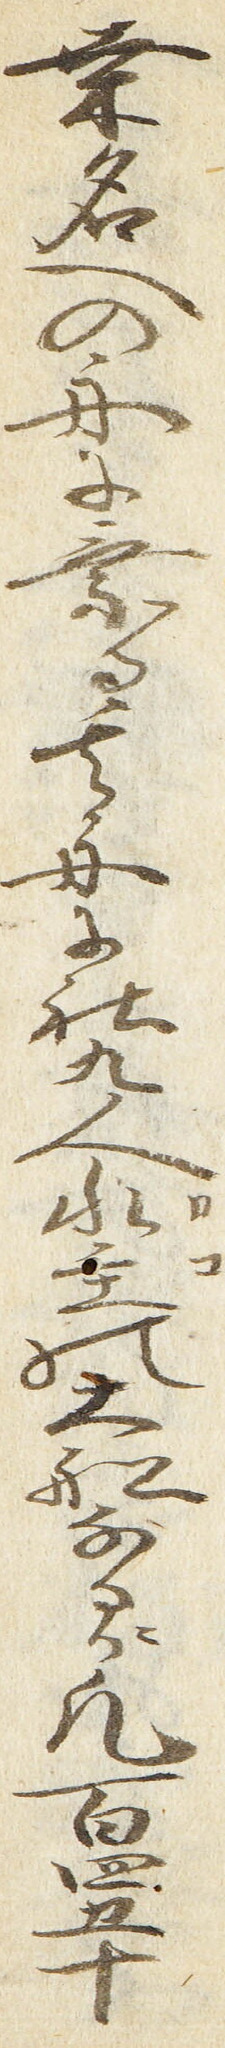桑名への舟に乗る其舟に社九人水主の大船なるが凡百四五十

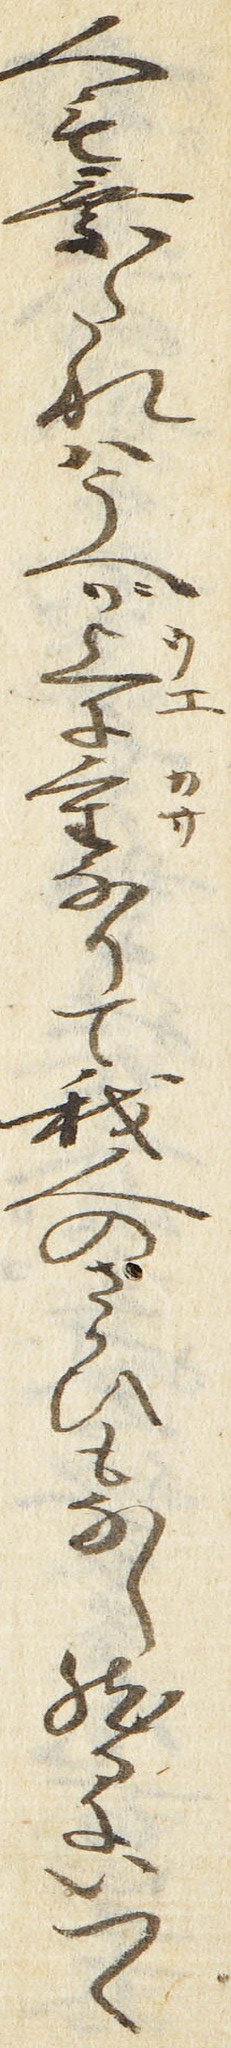人も乗たれはうへが上に重なりて我人のさかひもなし然るにいつく
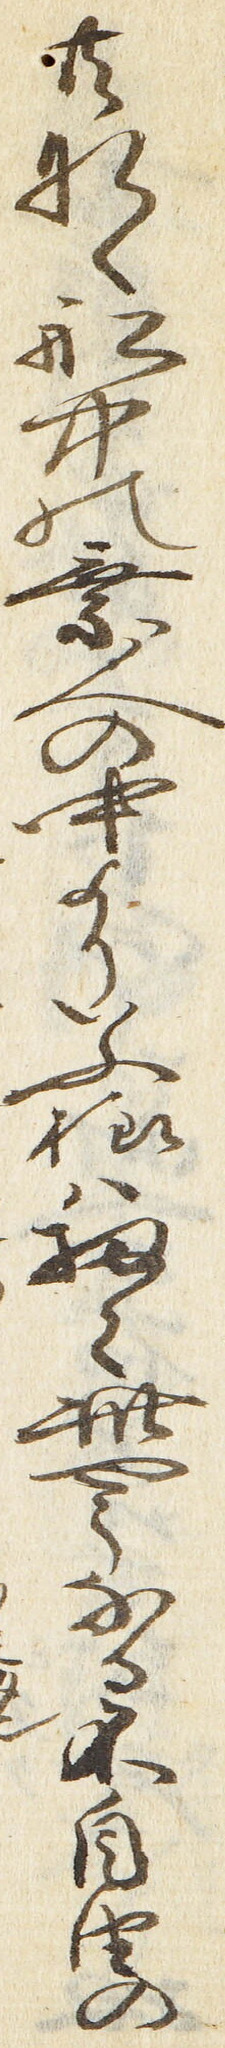共なく船中の乗人の中よりいふ様は扨々此やうなる不自由の
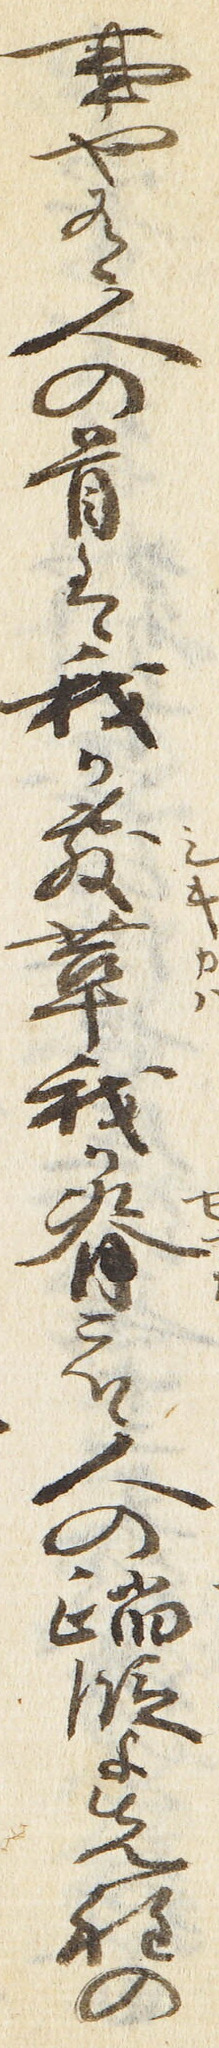事や有人の首は我か敷革我か背こそ人の踏段よ先程の
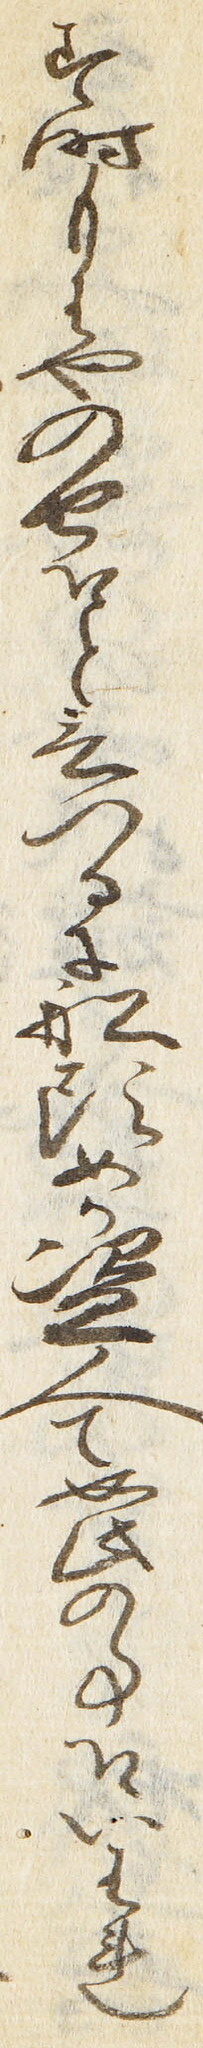す時もはやのせそと言つるに船頭めか盗人て如此の事そいはれ
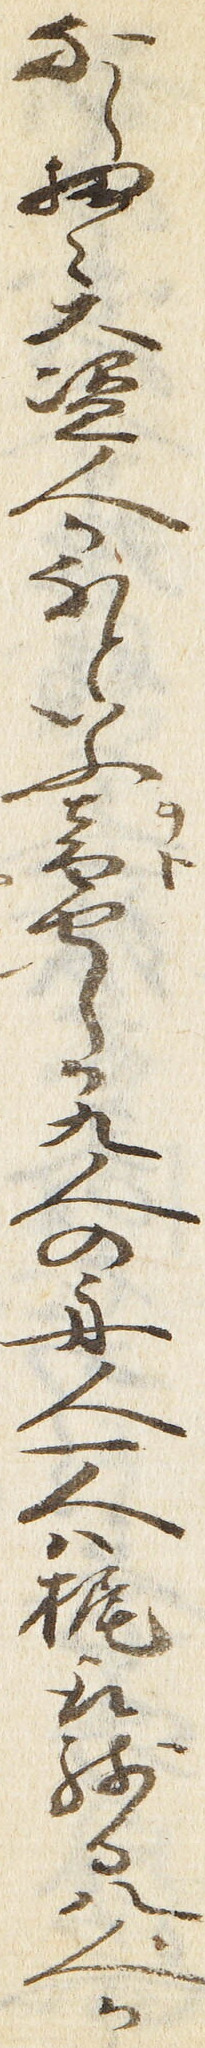なし扨々大盗人かなといふ音せしか九人の舟人一人は梶取残る八人か
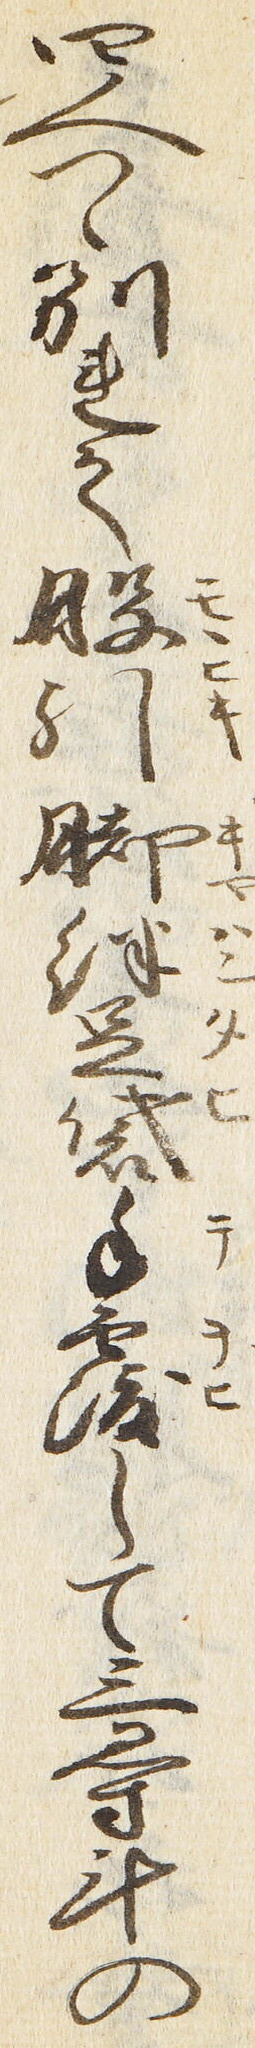四人つゝ別れて股引脚絆足袋手覆して三尋計の
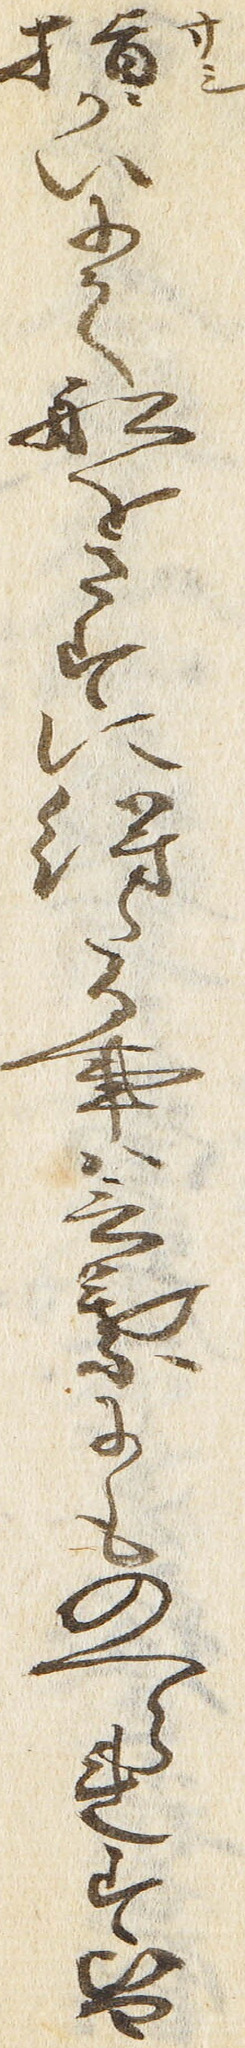指がいにて船をさすに得たる事は言葉にものへられす皆
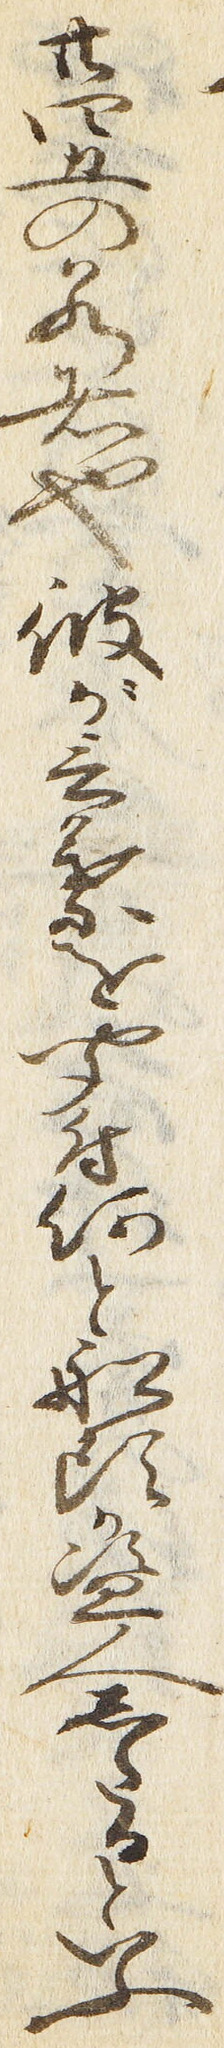廿四五の若者也彼が言葉を聞付何と船頭か盗人したるといふ
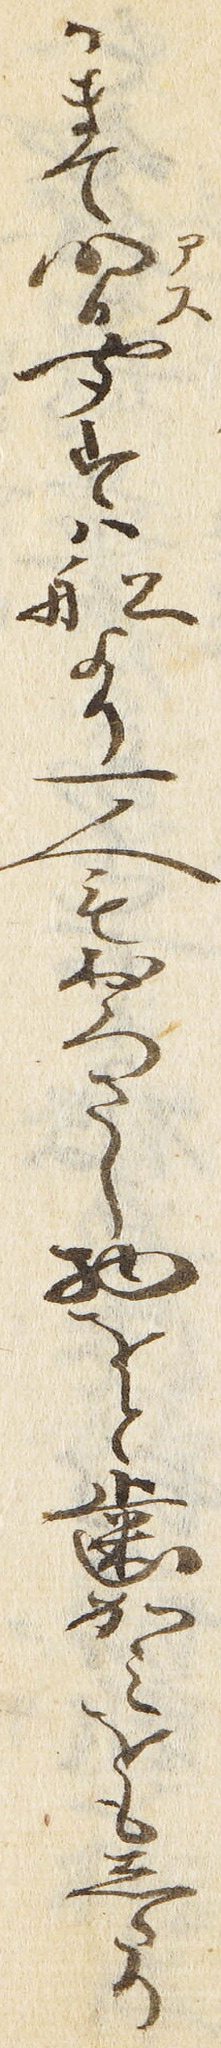かまて明日聞すは船より一人もおろさし物をと歯かみをもしたり
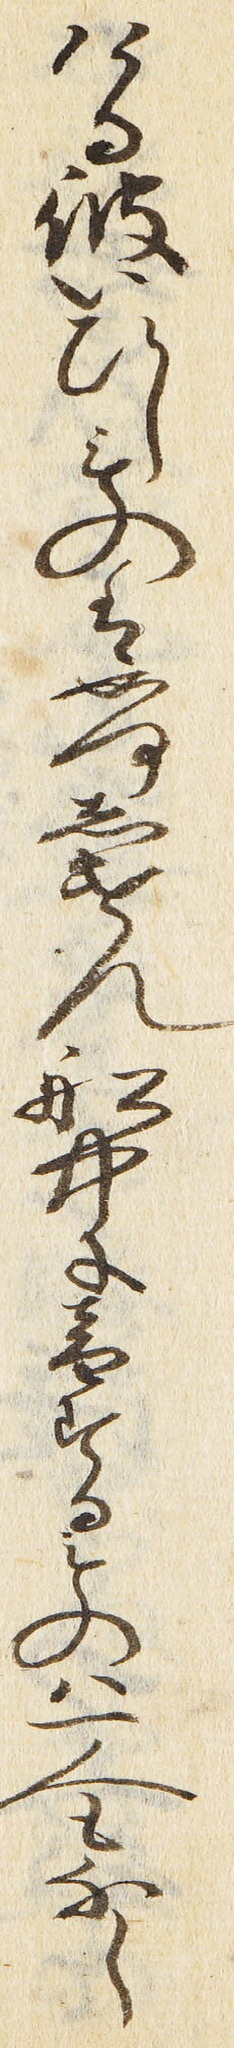今日彼いひしものは如何しけん船中に音するものは一人もなし
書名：海陸世話日記
